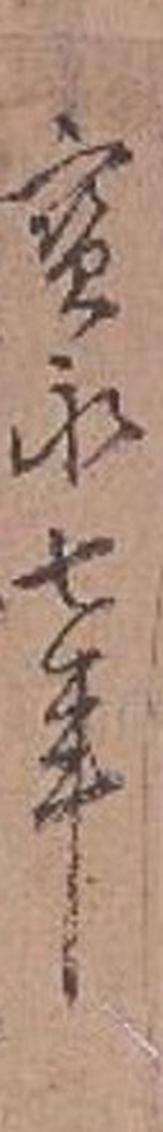宝永七年
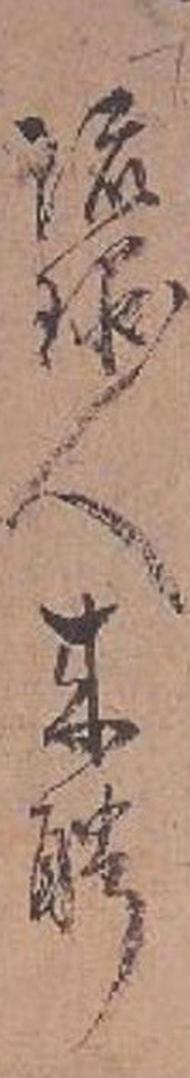琉球人来聘

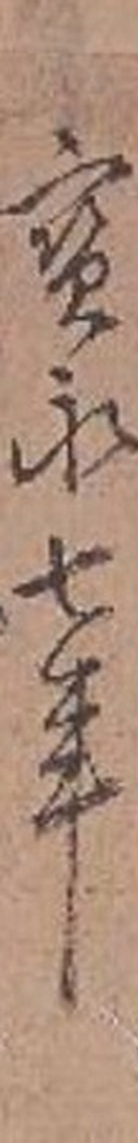宝永七年
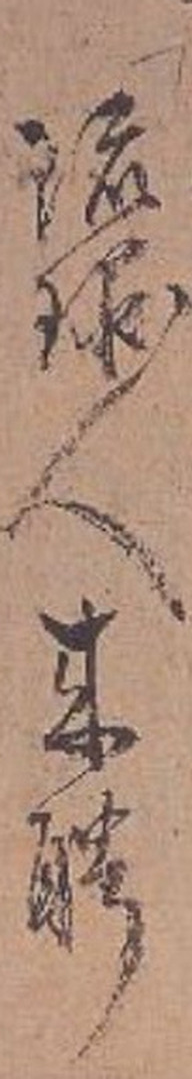琉球人来聘

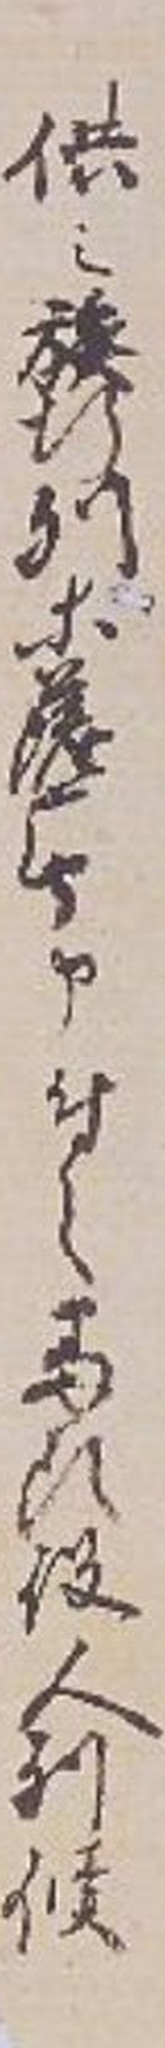供之族行列等薩摩守申付之番頭役人列候
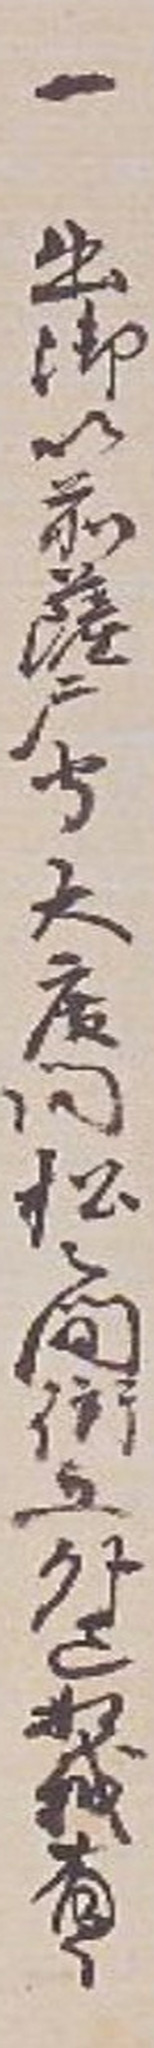一出御以前薩摩守大広間松之間衝立外迄相越有之
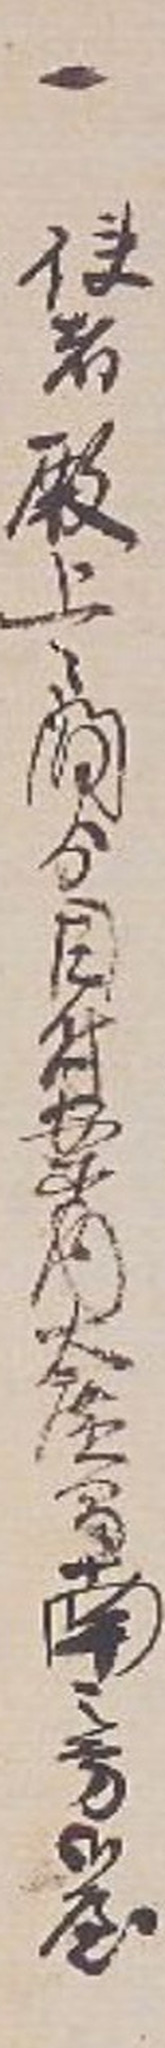一使者殿上之間ゟ目付案内大広間南之方御屋
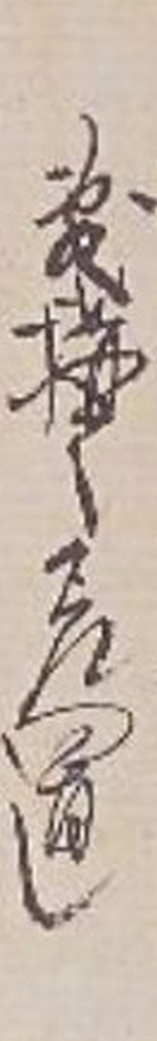敷構之差置
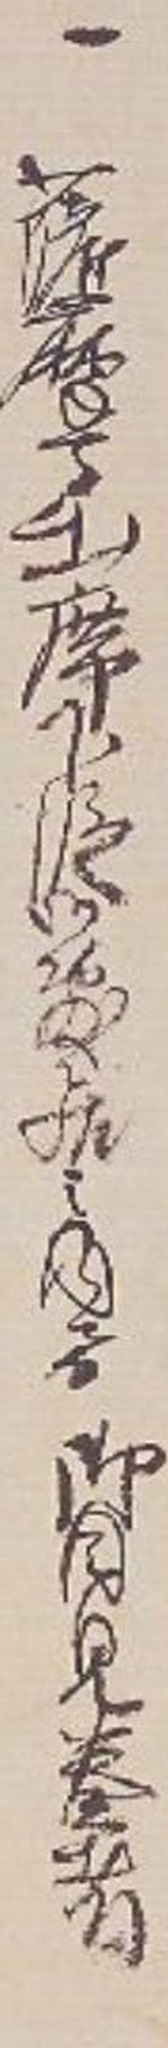一薩摩守出席下段御敷居之内に而御目見奏者
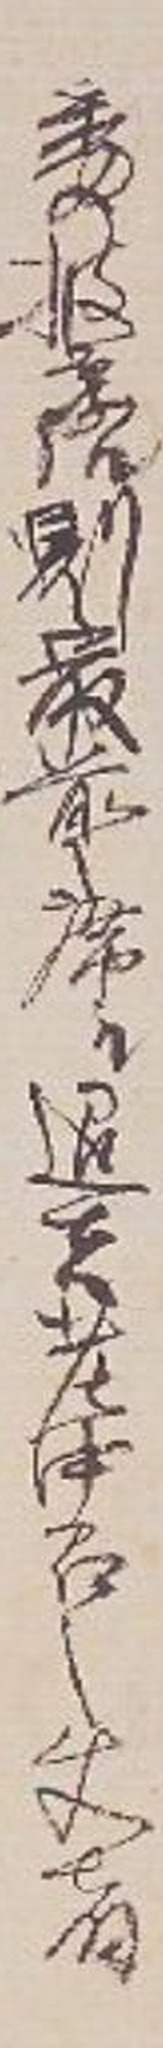番披露候則最前之席え退去老中召之使者
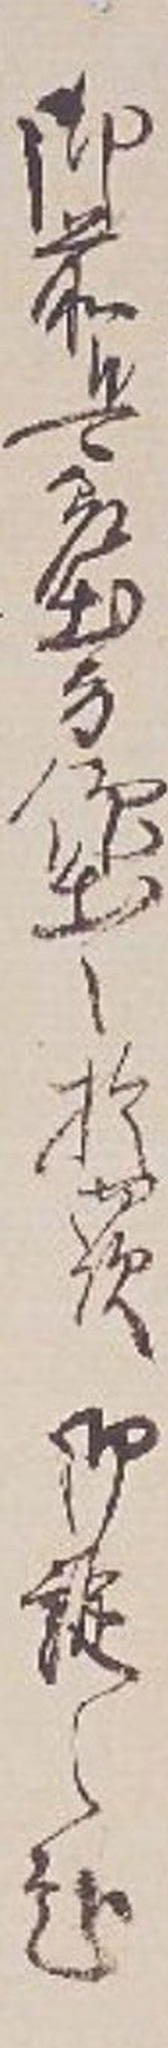御前え可差出旨仰出之於御次御諚之趣
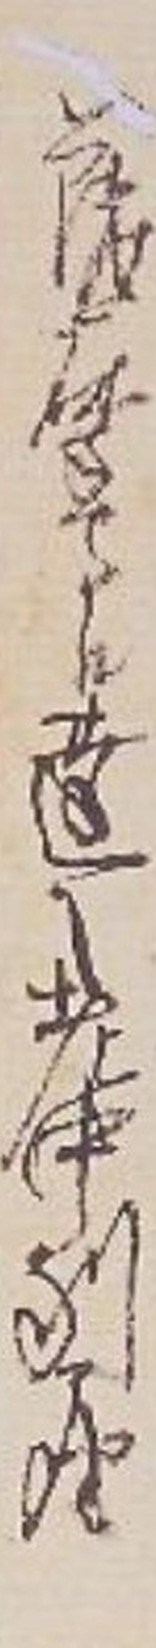薩摩守え達之老中列座
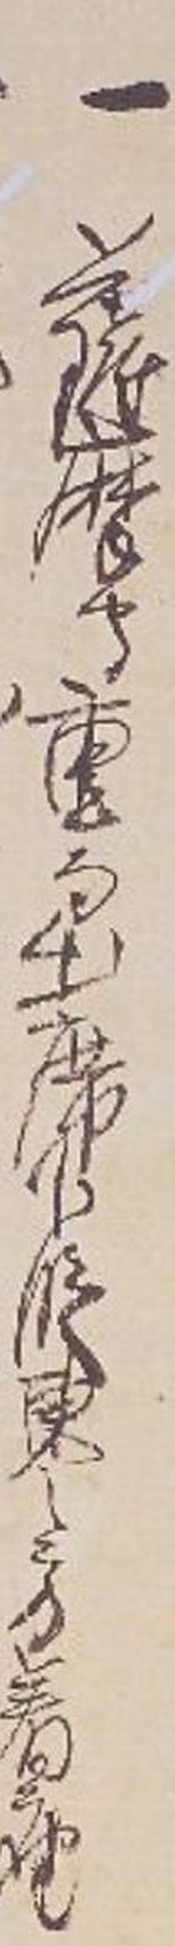一薩摩守重而出席下段東之方着座
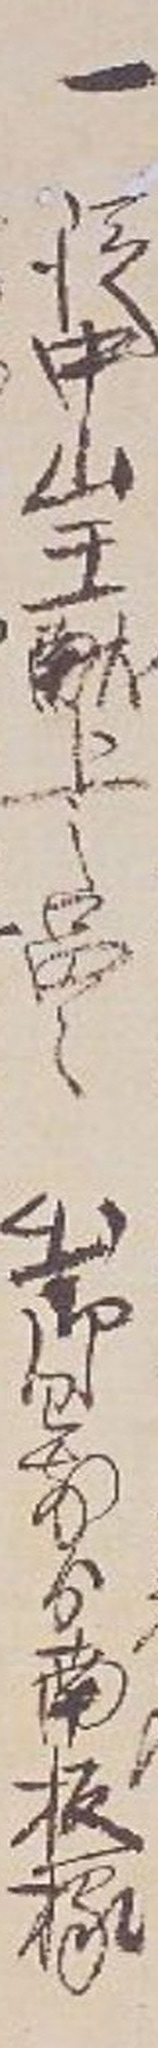一従中山王献上之品々出御已前ゟ南板縁
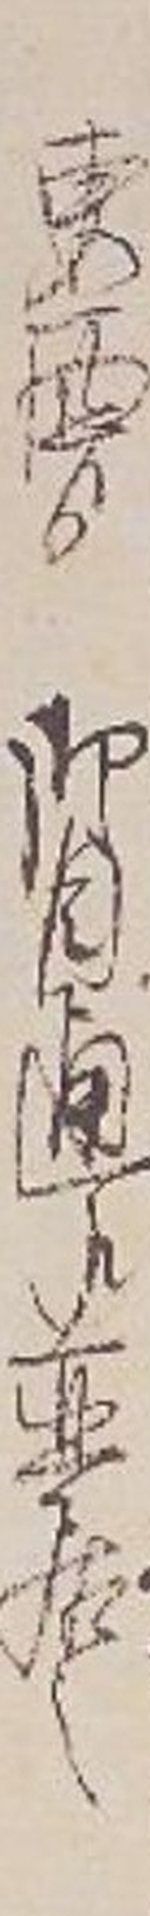東西ゟ御目通え並居之
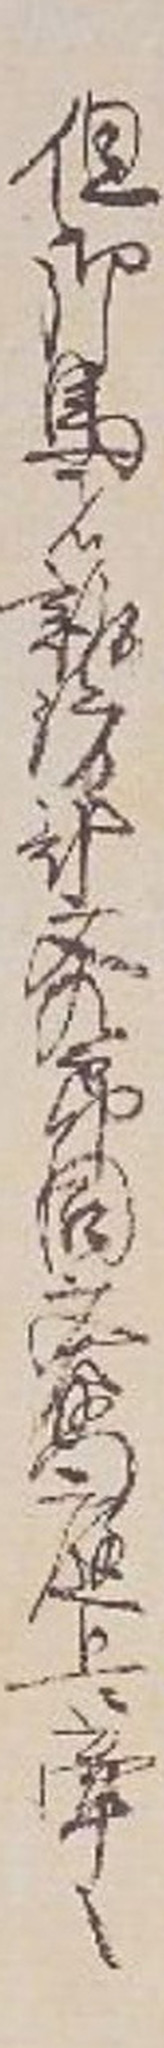但御馬は諏訪部文九郎同文左衛門庭上に牽之
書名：宝永七年 琉球人来聘
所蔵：University of the Ryukyus Library
